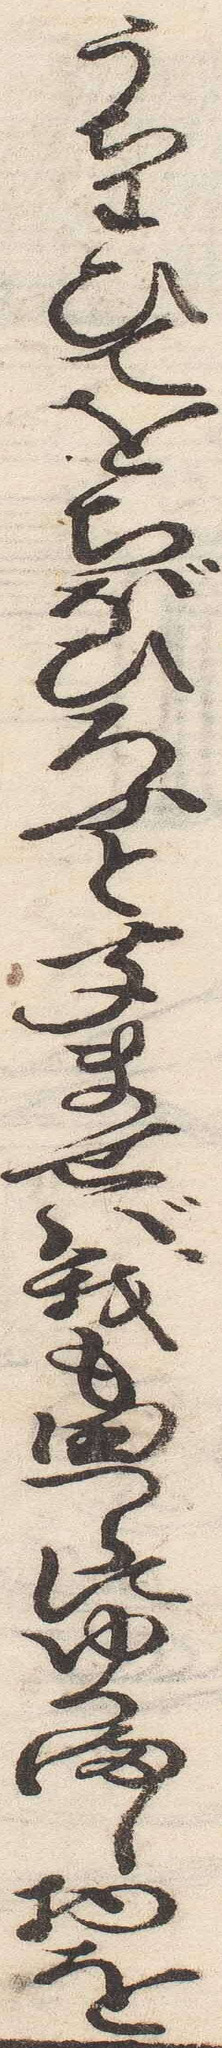うちにわひてをちぼひろふと聞ませば我も田つらにゆかまし物を
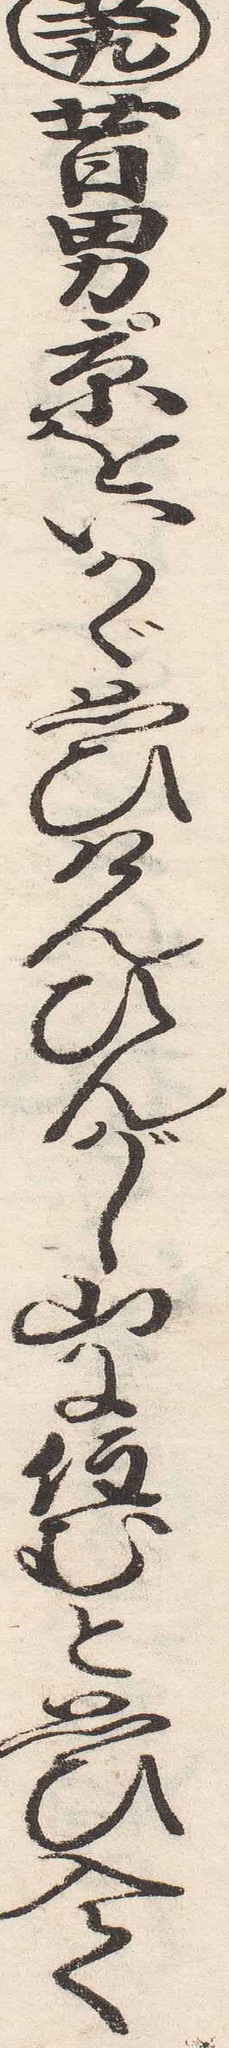五十九昔男。京をいかゞ思ひけんひんがし山に住むと思ひ入て
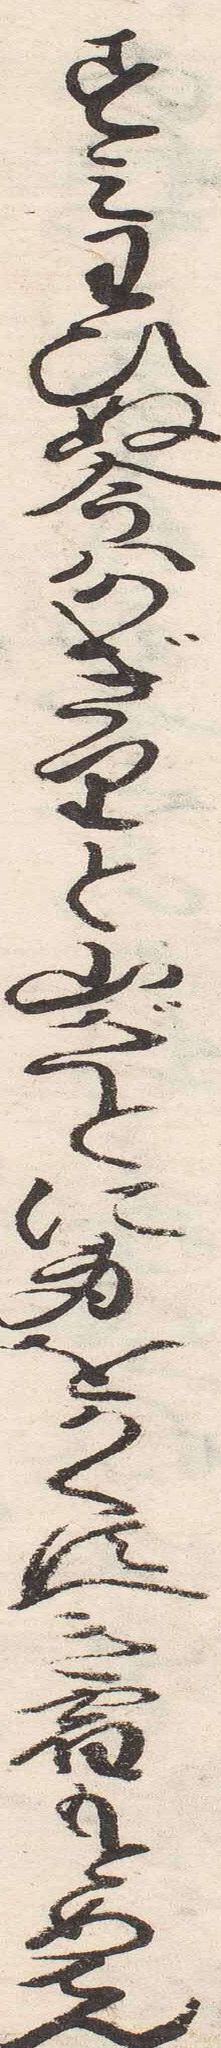すみわひぬ今はかぎりと山ざとに身をかくすへき宿もとめてん
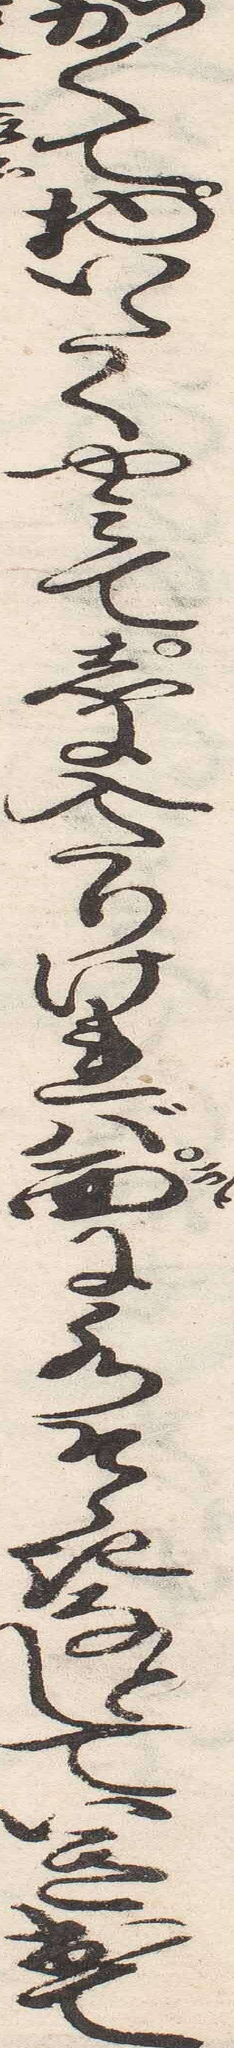かくて。物いたくやみて。しに入たりければ。面に水そゝきなとしていき出て
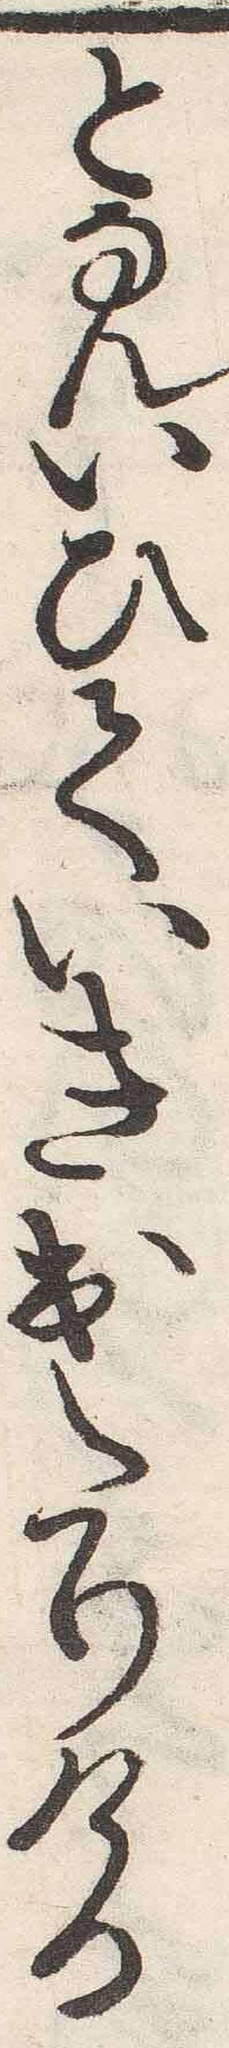となんいひていき出たりける
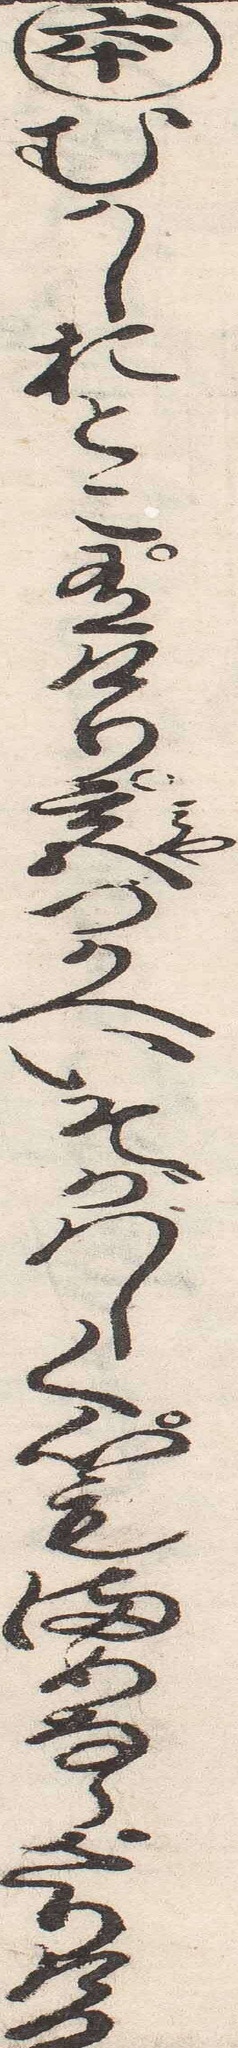六十むかしおとこ。有けり。宮つかへいそがはしく。心もまめならざりける
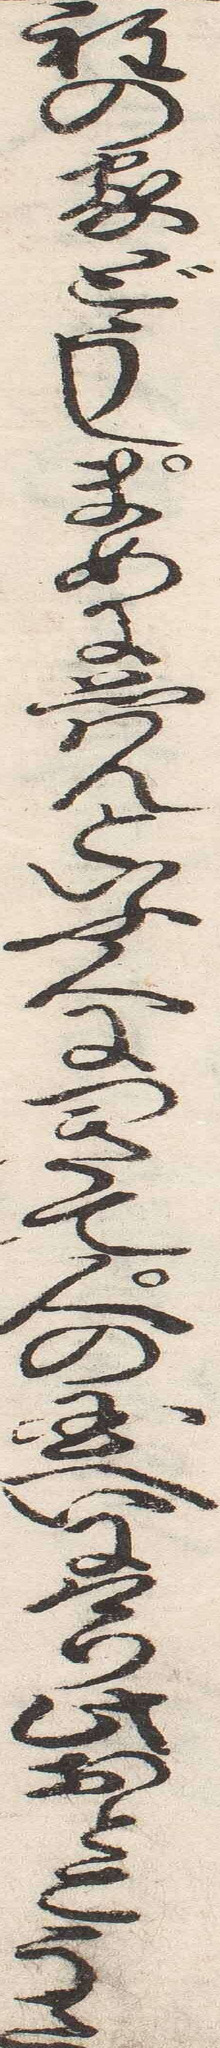程の家どうし。まめに思はんといふ人につきて。人の国へいにけり此おとこうさ
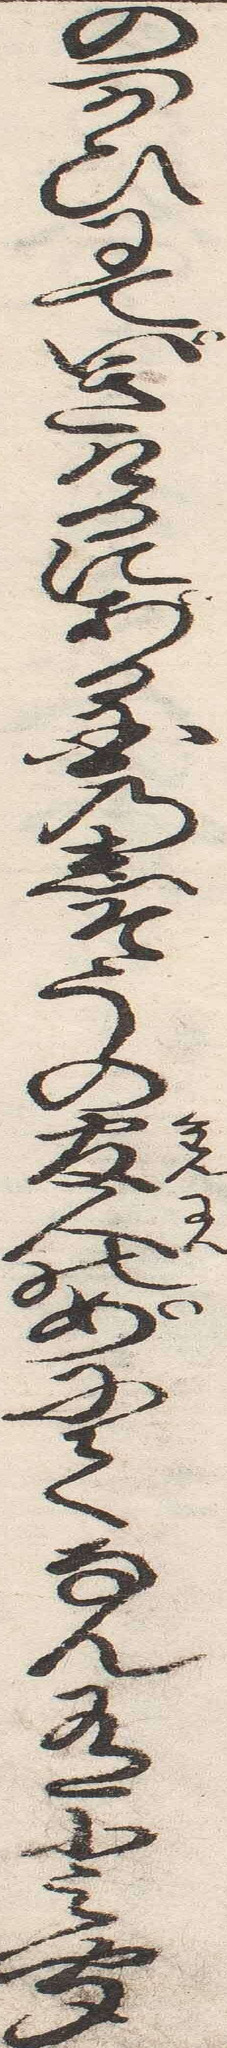のつかひにて。いきけるに。ある国のしそうの官人の。めにてなん有と聞
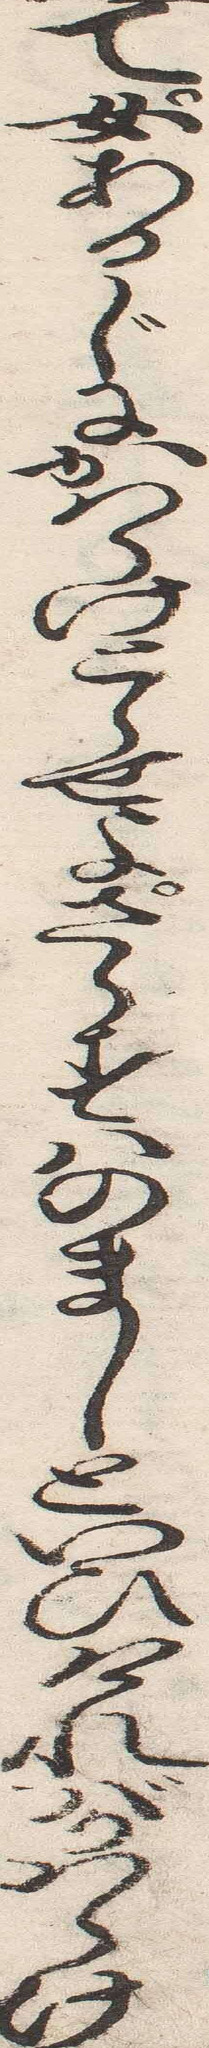て。女あるじにかはらけとらせよ。さらすはのましといひければかはらけ
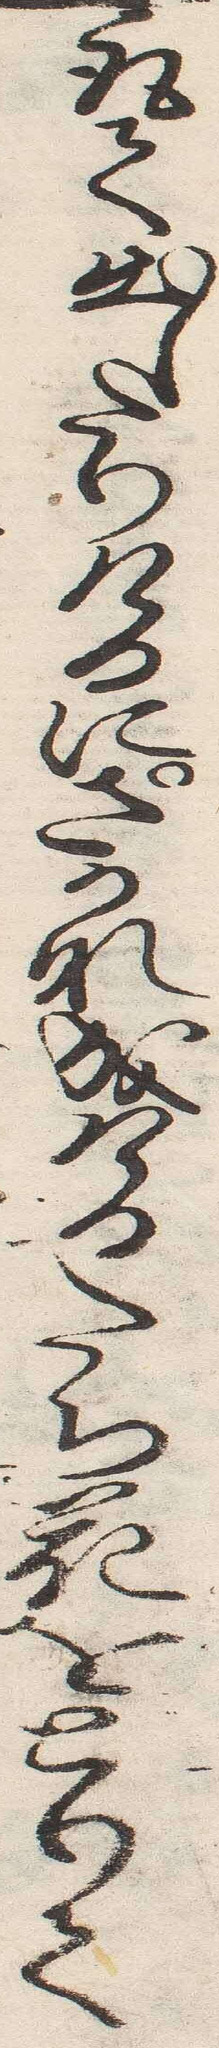取て出したりけるに。さかな成けるたち花をとりて
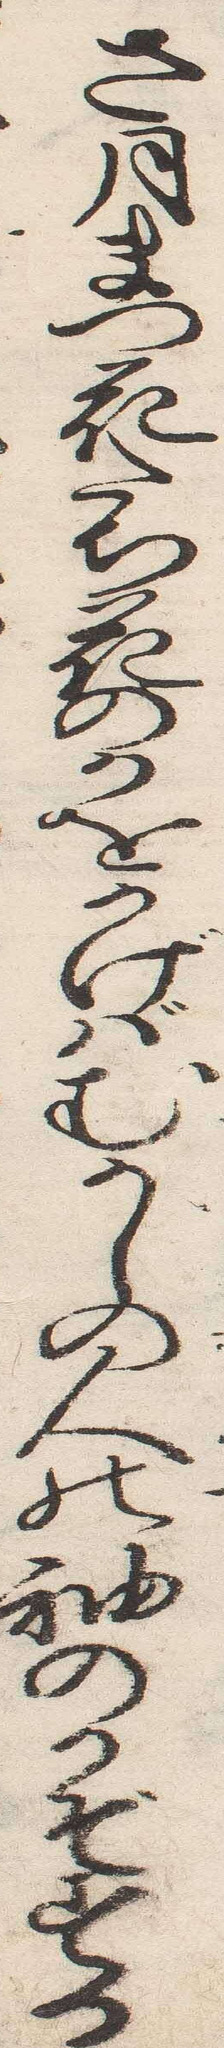さ月まつ花たち花のかをかげばむかしの人の袖のかぞする
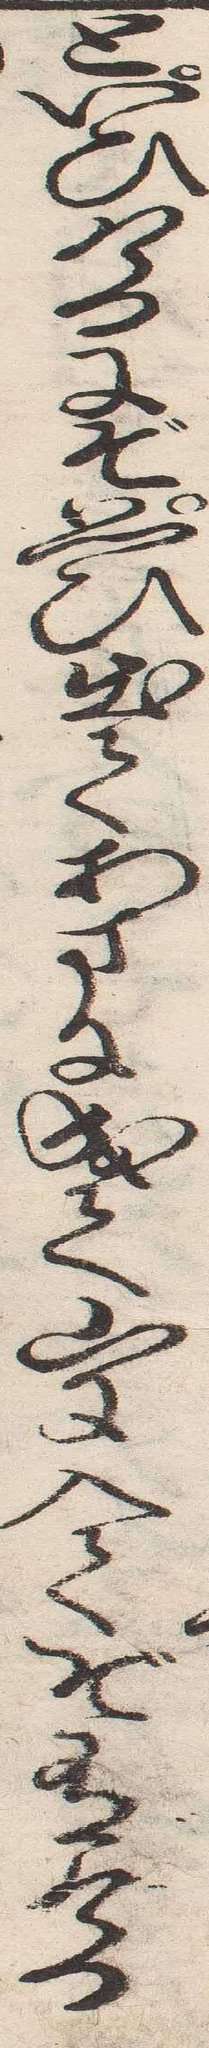と。いひけるにぞ。思ひ出てあまに成て山に入てぞ有ける
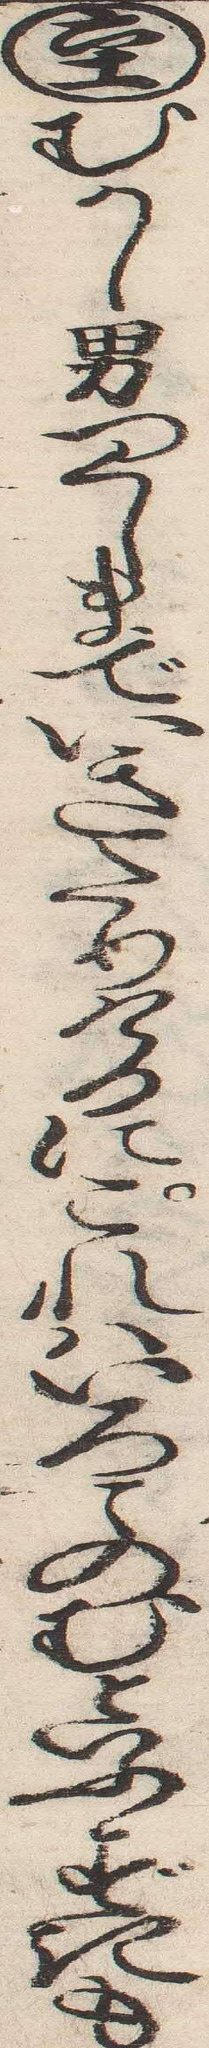六十一むかし男つくしまでいきたりけるに。これはいろこのむといふずきも

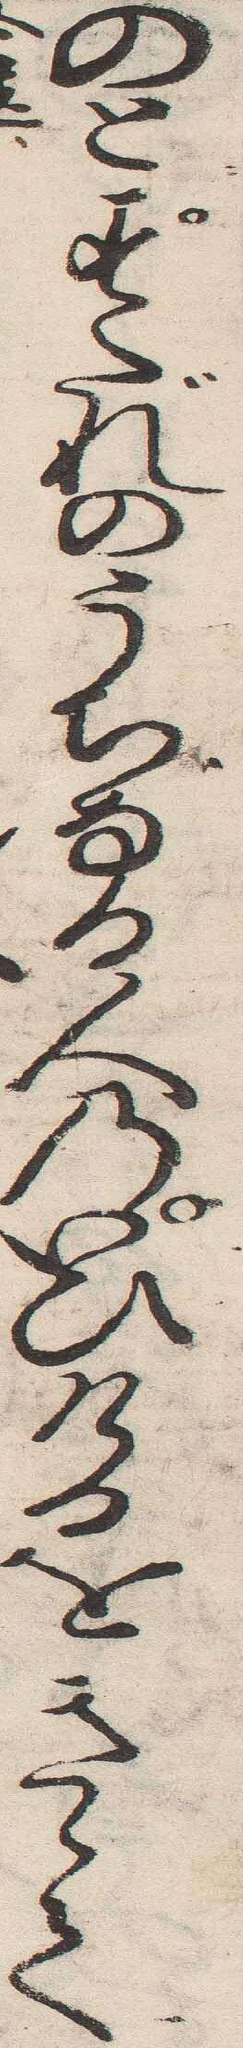のと。すだれのうちなる人の。いひけるをきゝて
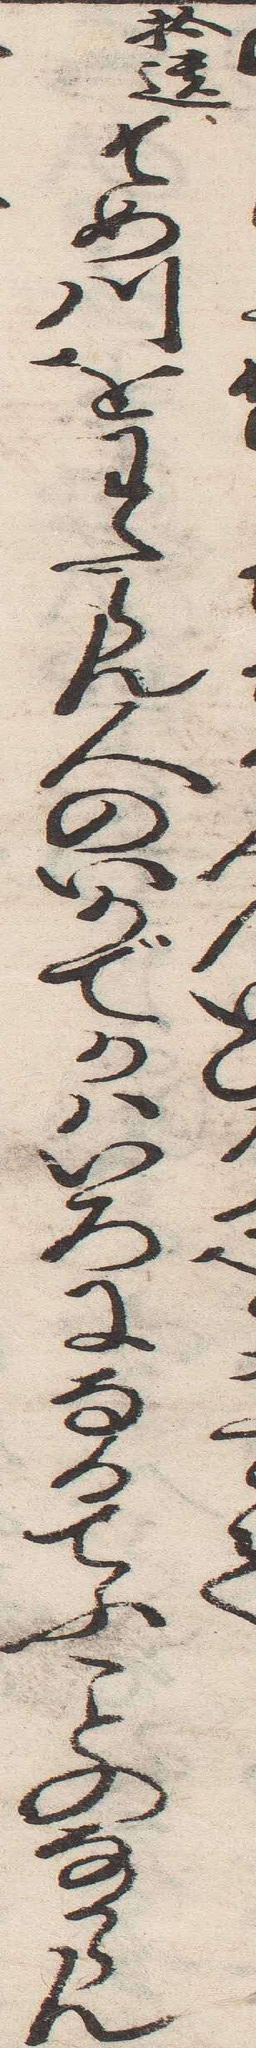拾遺そめ川をわたらん人のいかでかはいろになるてふことのなからん
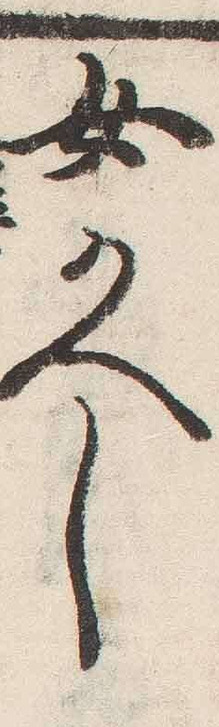女かへし
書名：伊勢物語
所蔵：東京学芸大学附属図書館 国文学研究資料館
